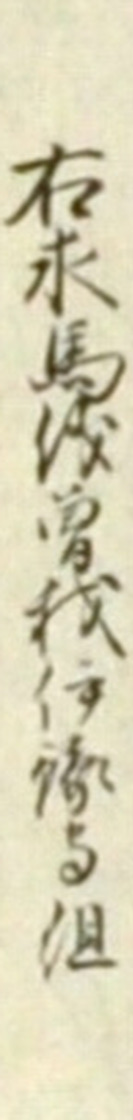右永馬儀曽我伊予守組
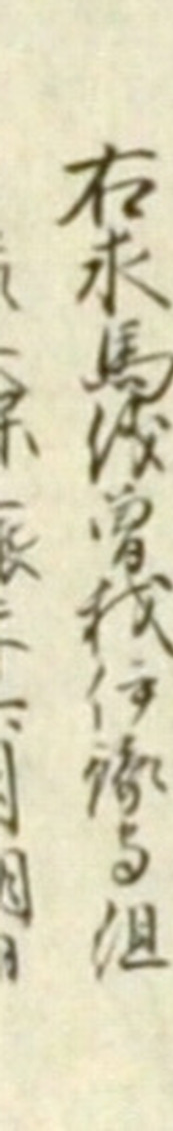右永馬儀曽我伊予守組
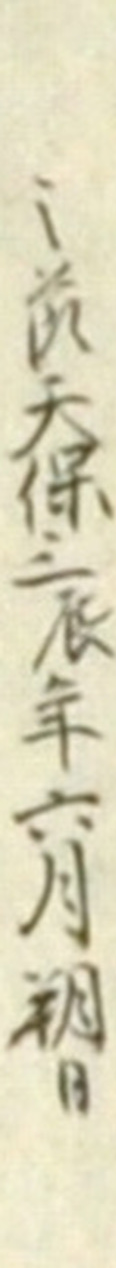之節天保三辰年六月朔日
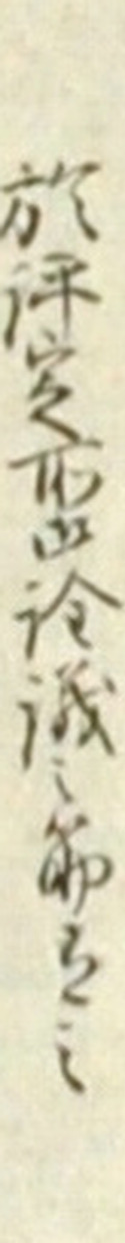於評定所御詮議之節有之
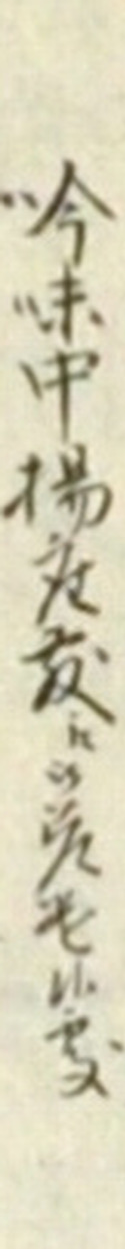吟味中揚座敷江御差遣候処
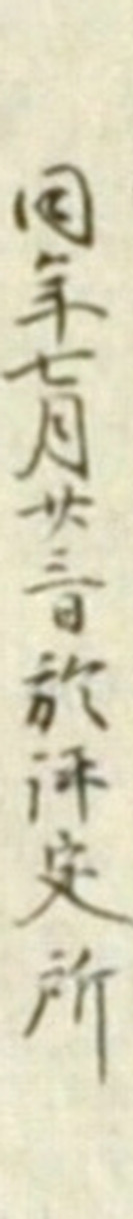同年七月廿三日於評定所
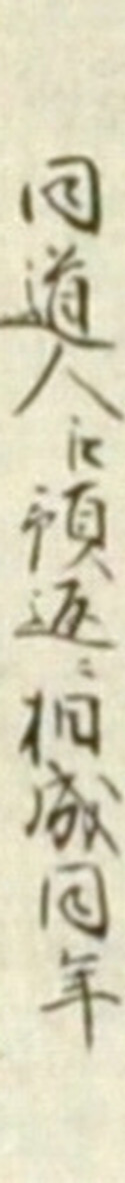同道人江預返ニ相成同年
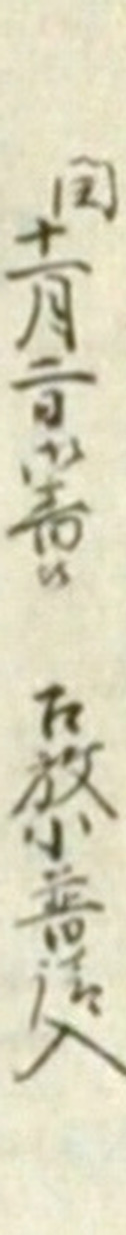閏十一月二日御番被相放小普請入
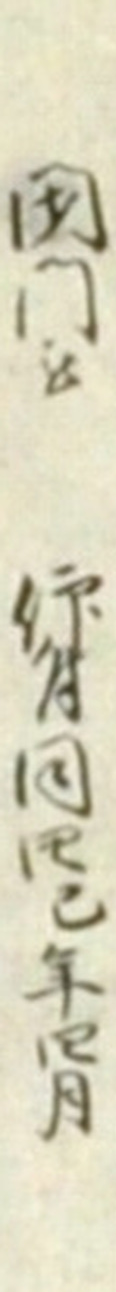閉門被仰付同四巳年四月
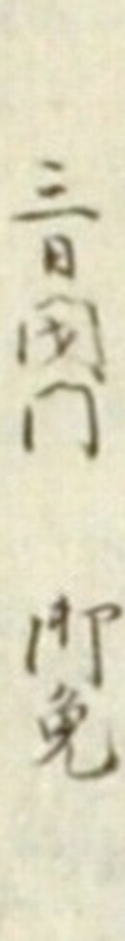三日閉門御免
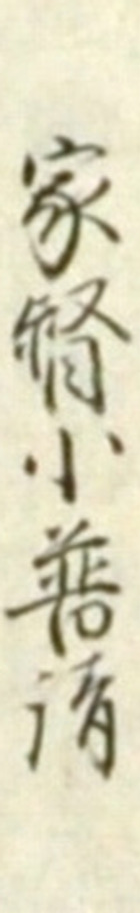家督小普請
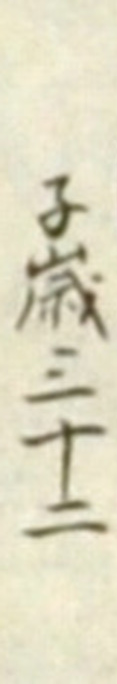子歳三十二
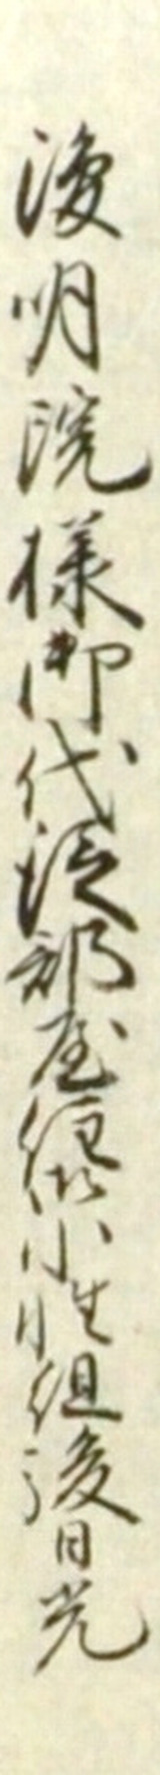浚明院様御代従部屋住御小姓組後日光
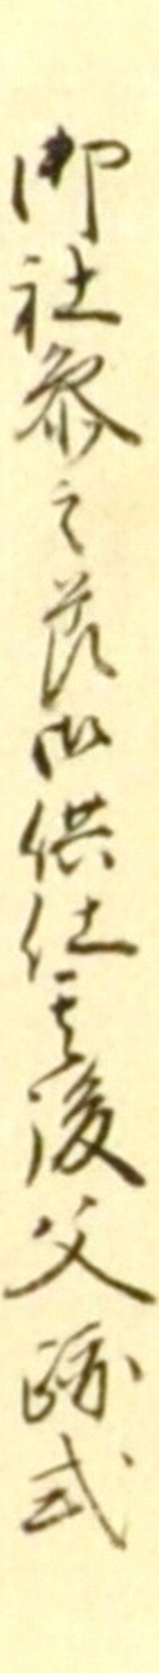御社参之節御供仕其後父跡式
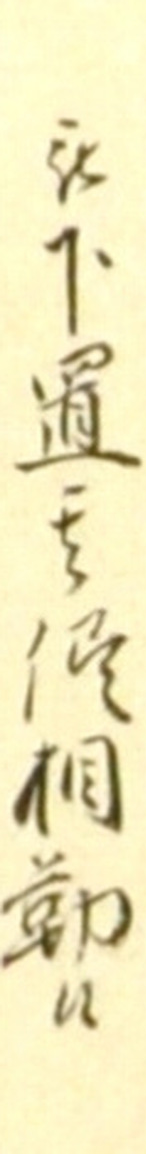被下置其侭相勤候
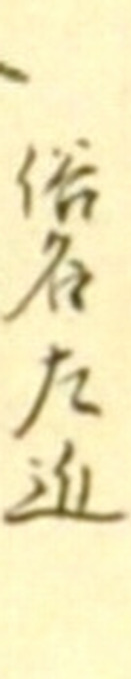俗名左近
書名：若年寄御役中御調書付
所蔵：伊那市立高遠町図書館・合同会社AMANE
